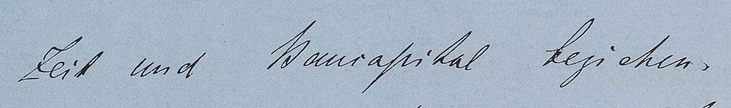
zeit und Baucapital beziehen.
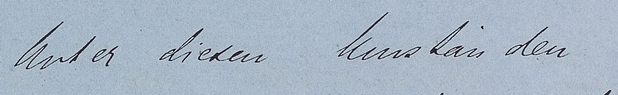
Unter diesen Umständen
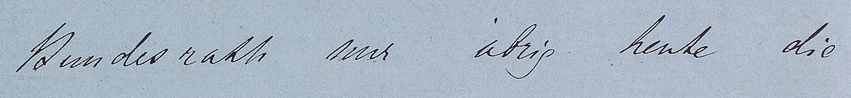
Bundesrath nur übrig heute die
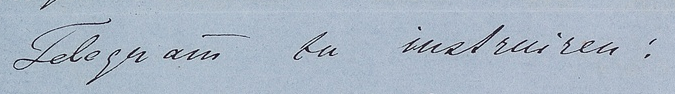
Telegramm zu instruiren:
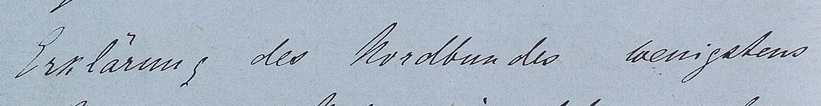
Erklärung des Nordbundes wenigstens
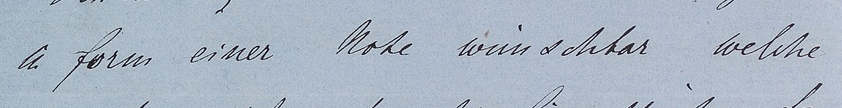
in Form einer Note wünschbar welche
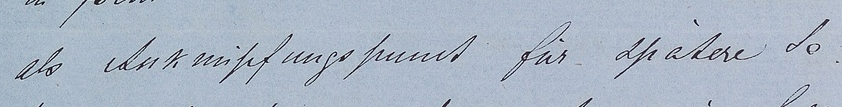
als Anknüpfungspunct für spätere Se-
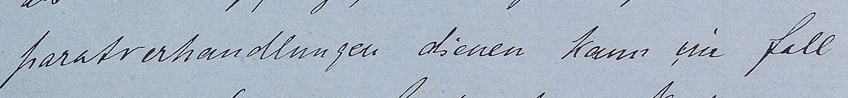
paratverhandlungen dienen kann im Fall
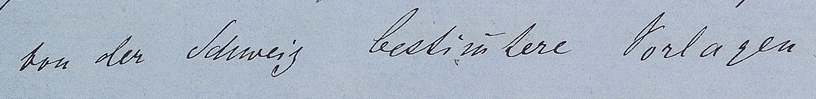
von der Schweiz bestimmtere Vorlagen
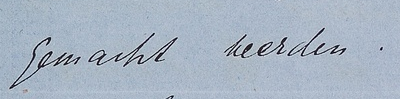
gemacht werden.
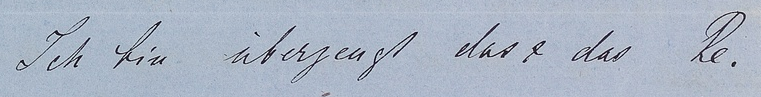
Ich bin überzeugt dass das Re-
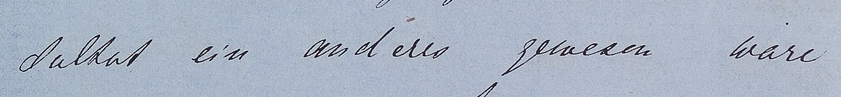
sultat ein anderes gewesen wäre
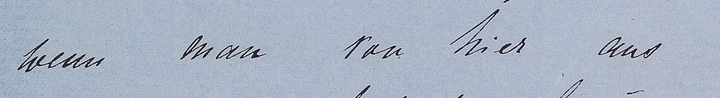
wenn man von hier aus
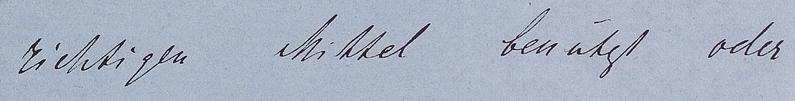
richtigen Mittel benützt oder
